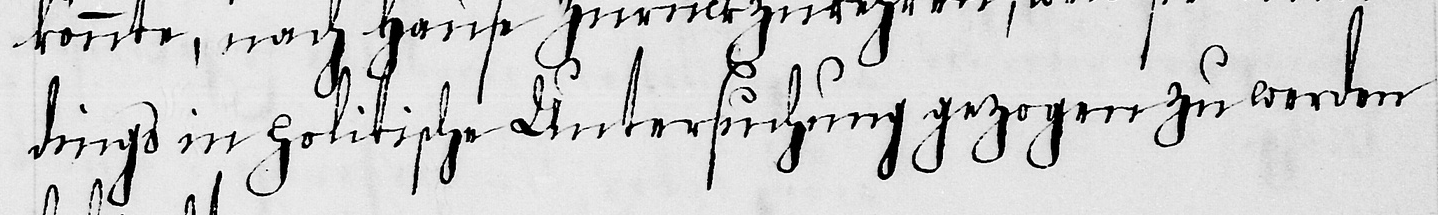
dings in politische Untersuchung gezogen zu werden
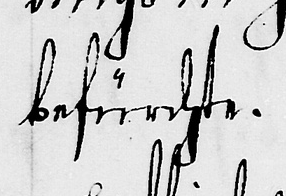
befürchte.
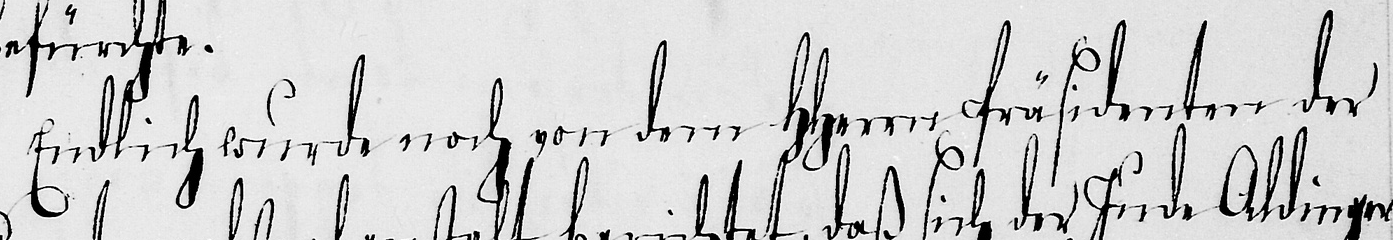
Endlich wurde noch von dem HHerrn Präsidenten
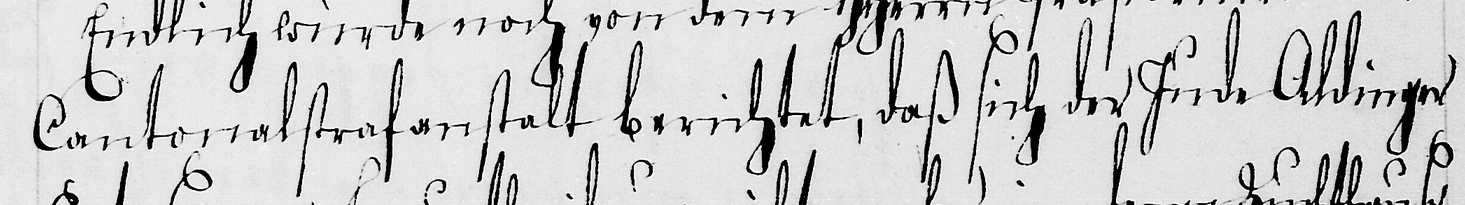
Cantonalstrafanstalt berichtet, daß sich der Jude Aldinger
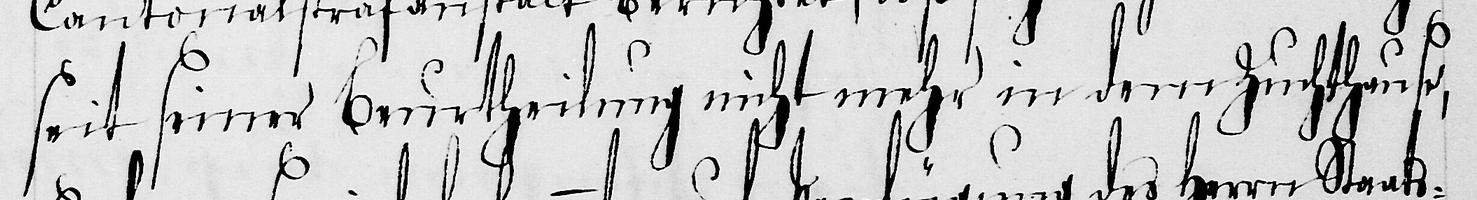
seit seiner Beurtheilung nicht mehr in dem Zunfthause,
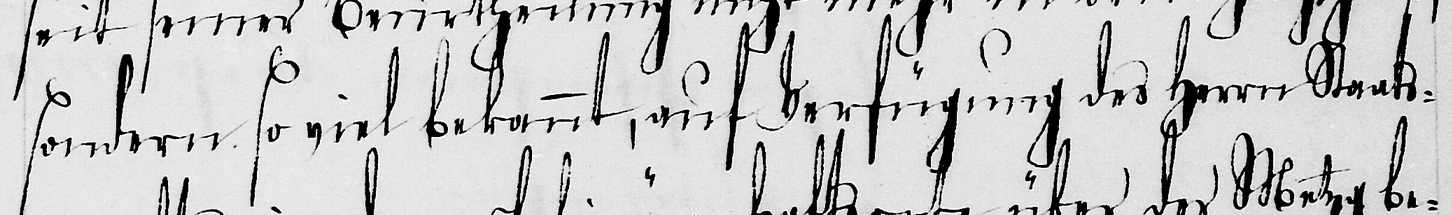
sondern so viel bekannt, auf Verfügung des Herrn Sta¬
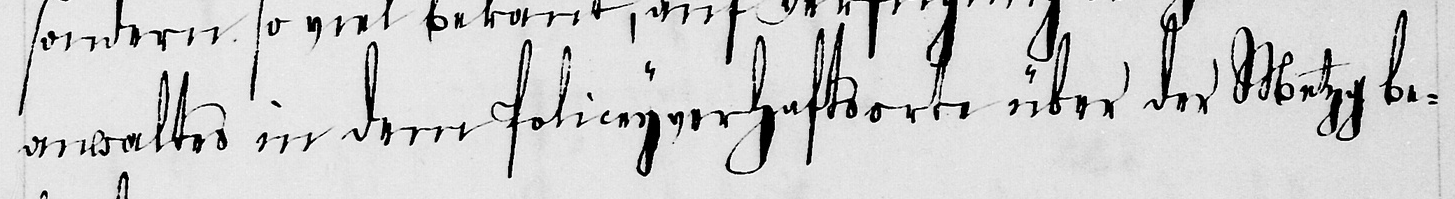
anwaltes in dem Policeyverhaftsorte über der Metzg be¬
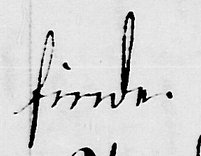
finde.
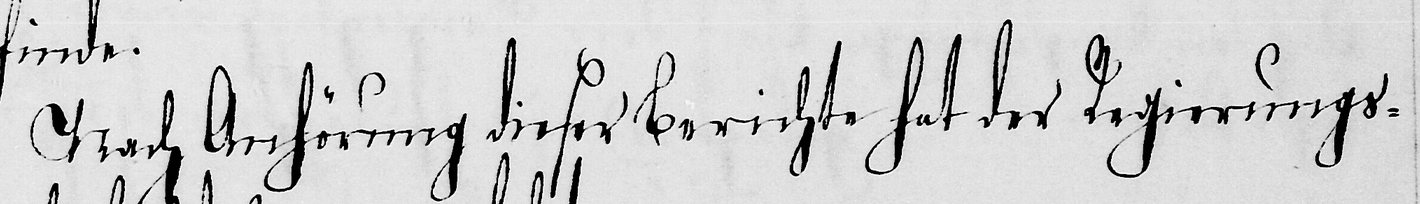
Nach Anhörung dieser Berichte hat der Regierungsr¬
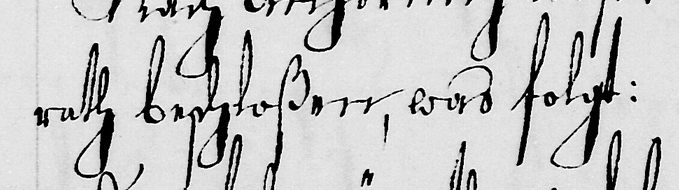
h beschloßen, was folg¬
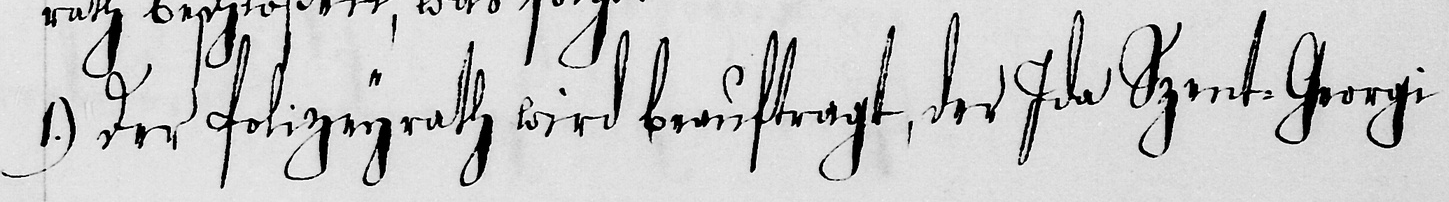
1.) Der Policeyrath wird beauftragt, der Ida Szent-Georgi
